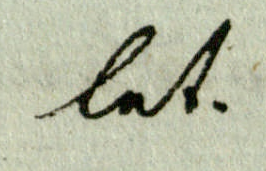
let.
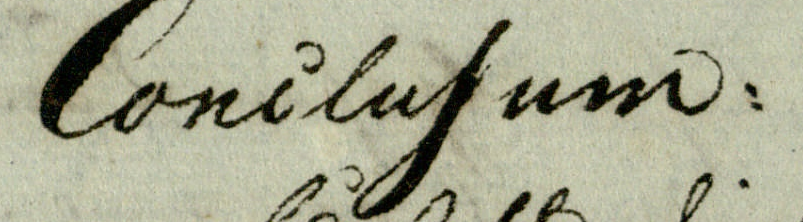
Conclusum:
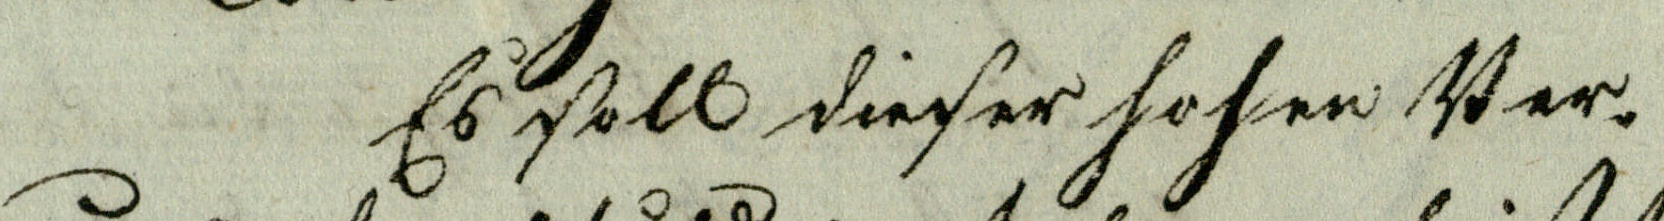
Es soll dieser hohen Ver¬
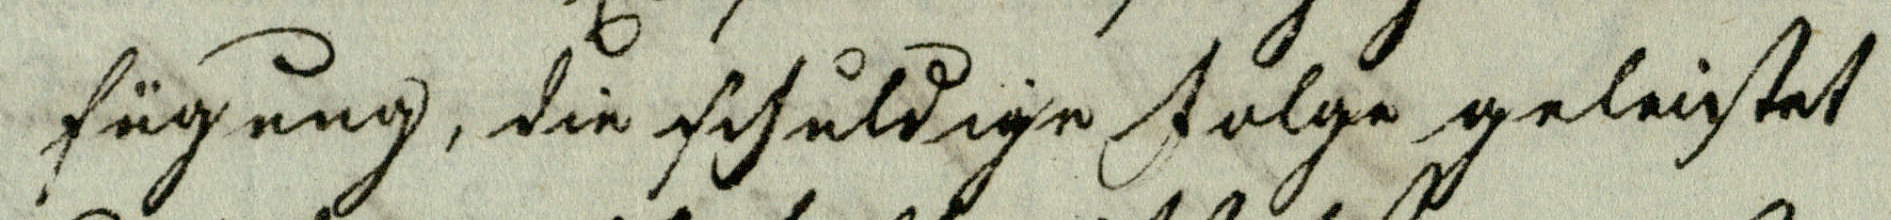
fügung, die schuldige Folge geleistet
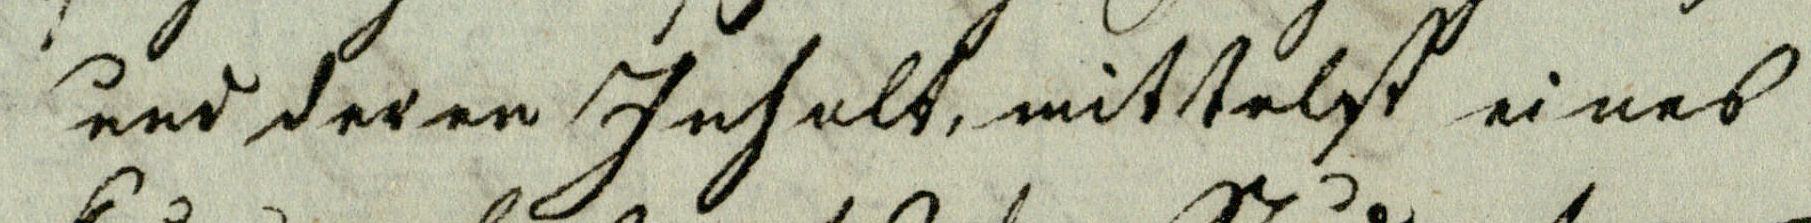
und deren Inhalt, mittelst eines
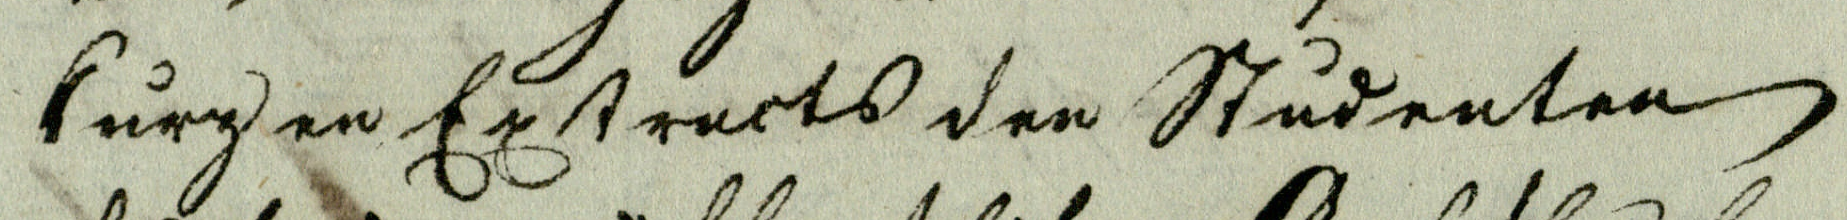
kurzen Extracts den Studenten
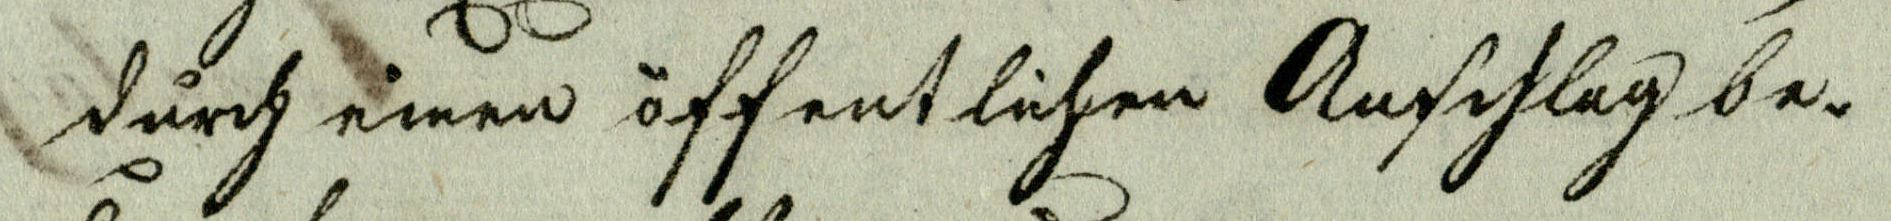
durch einen öffentlichen Anschlag be¬
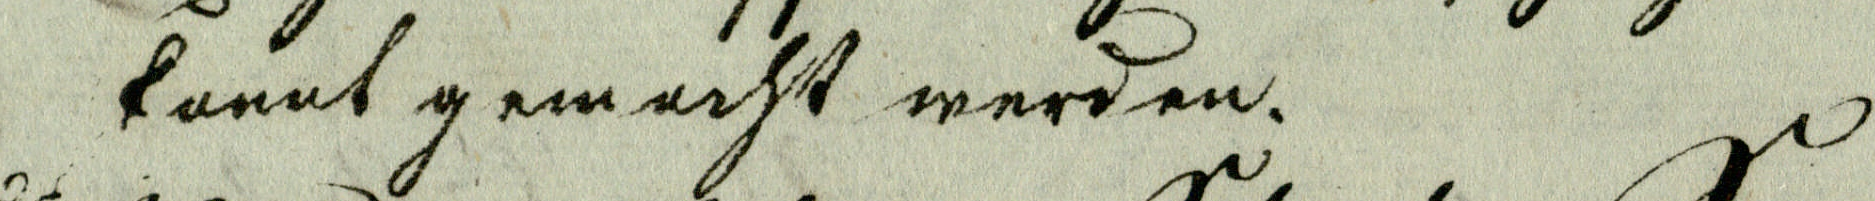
kannt gemacht werden.
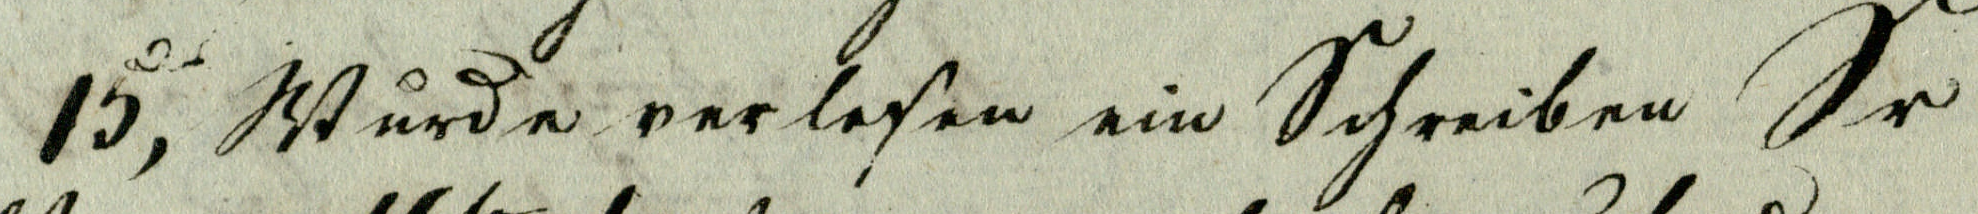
15, Wurde verlesen ein Schreiben Sr
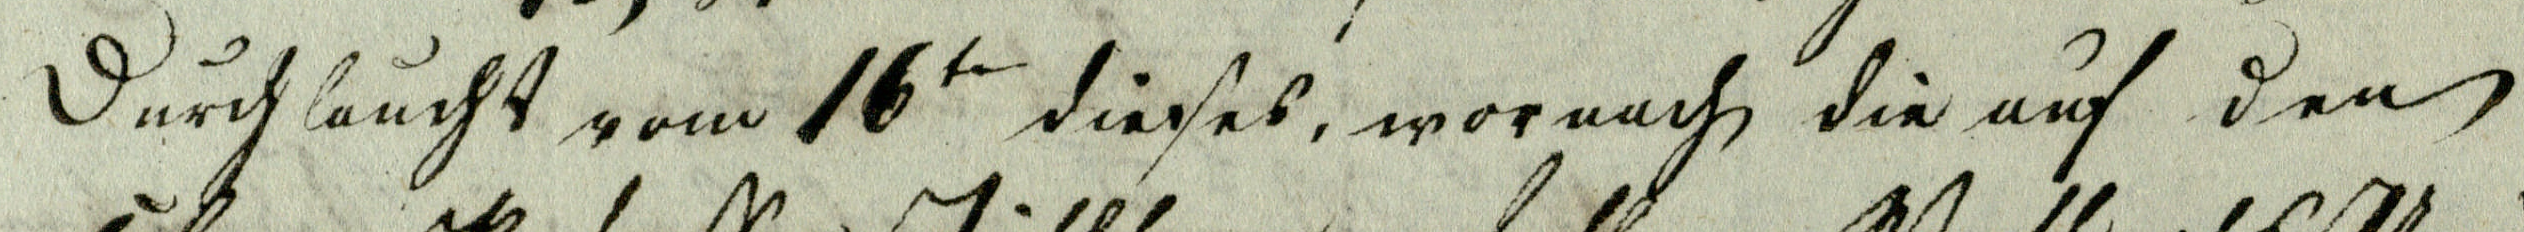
Durchlaucht vom 16ten dieses, wornach die auf den
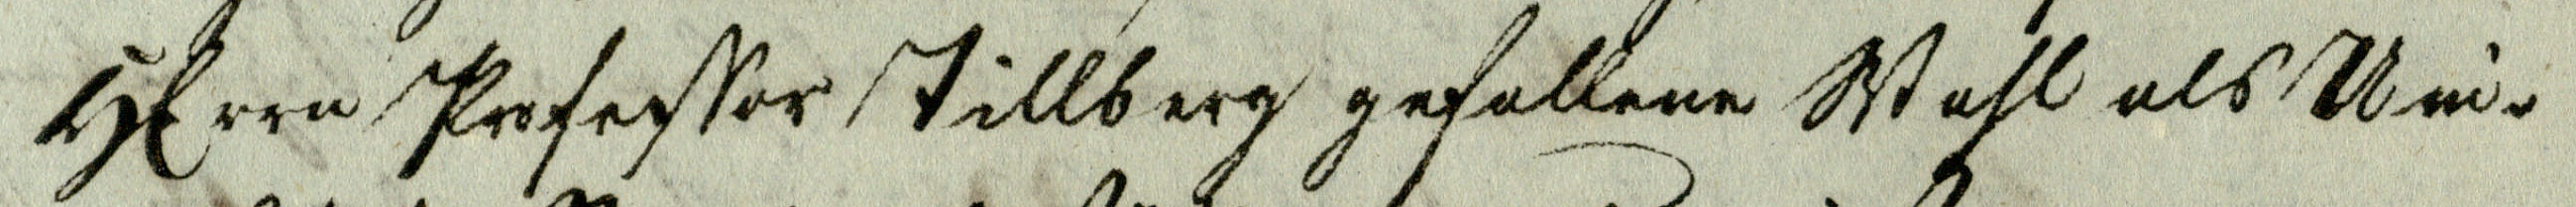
HErrn Professor Tillberg gefallene Wahl als Uni¬
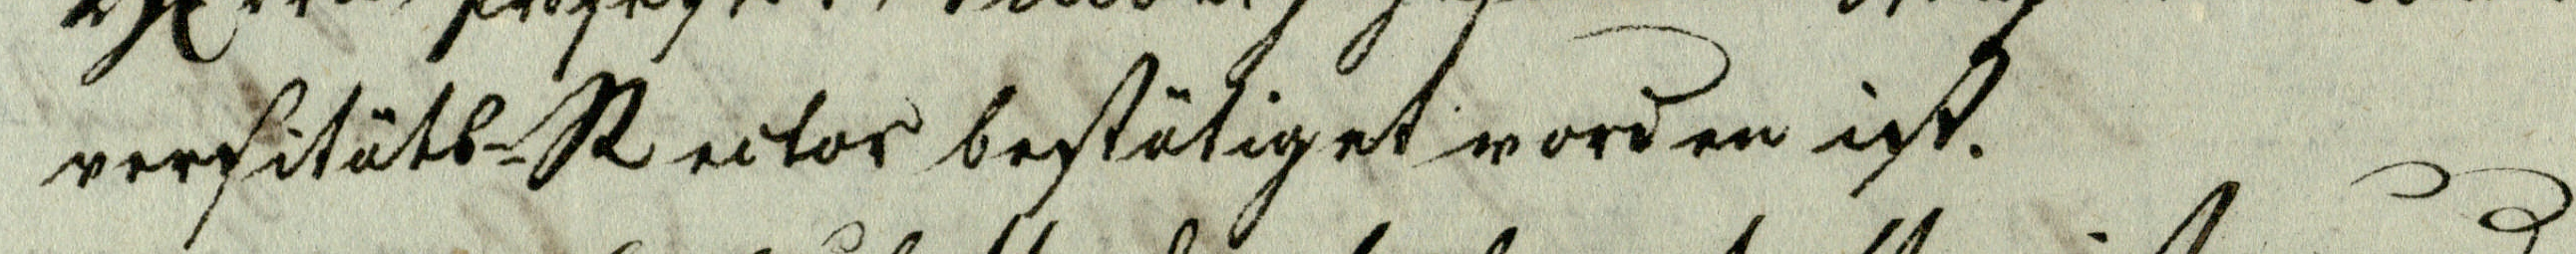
versitäts-Rector bestätiget worden ist.
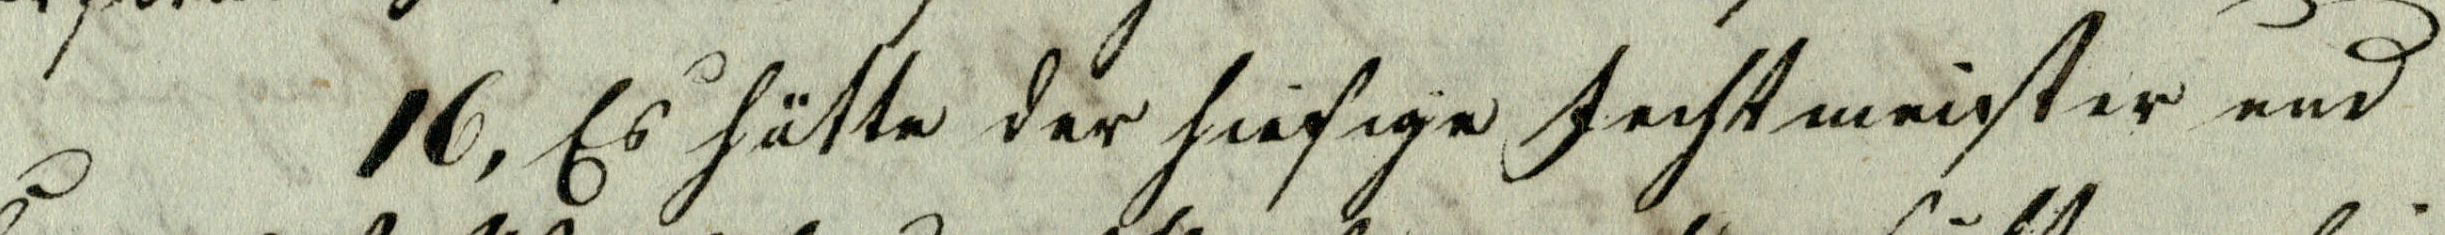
16, Es hätte der hiesige Fechtmeister und
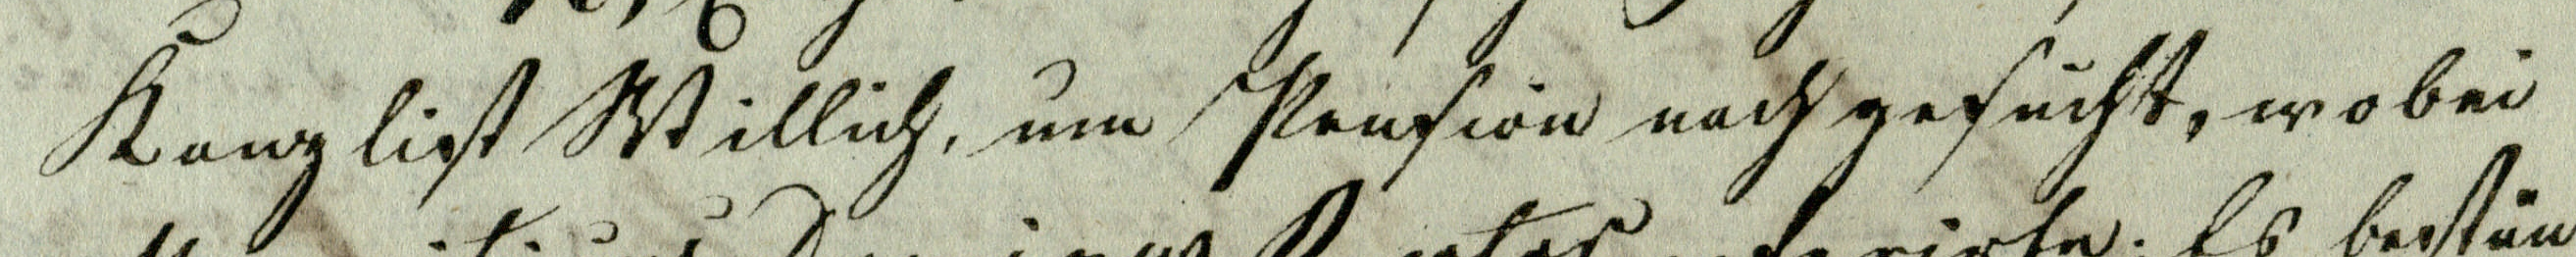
Kanzlist Willich, um Pension nachgesucht, wobei
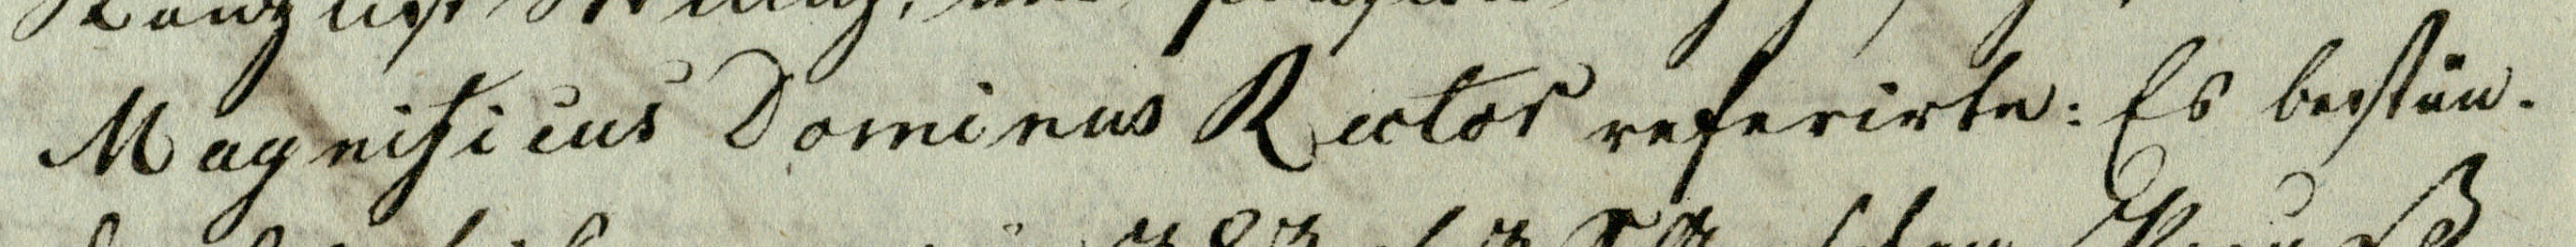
Magnificus, Dominus Rector referirte: Es bestün¬
